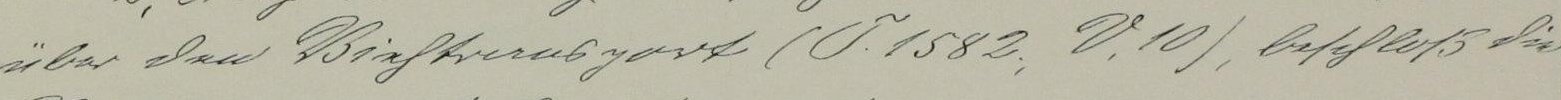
über den Viehtransport (T.1582; V.10), beschloß die
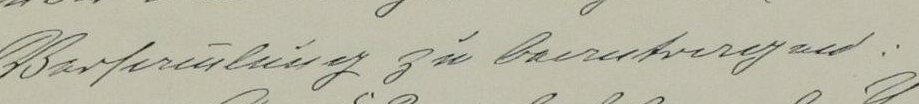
Versammlung zu beantragen:
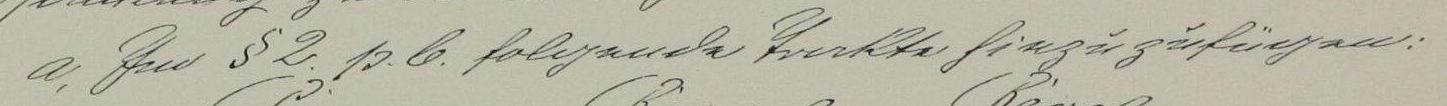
a. Im § 2 p. . folgende Trakte hinzuzufügen:
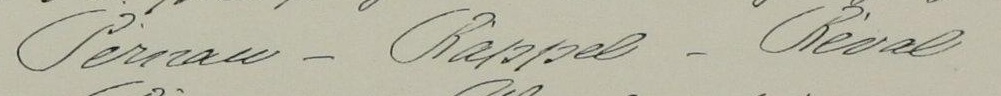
Pernau – Rappel – Reval
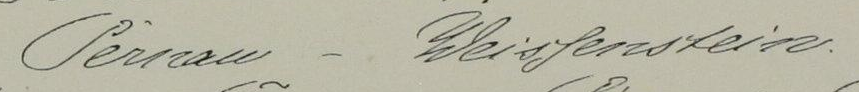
Pernau – Weissenstein.
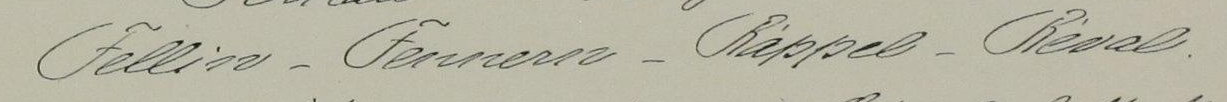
Fellin – Fennern – Rappel – Reval.
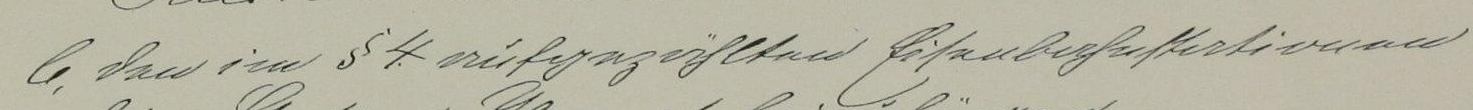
b. den im § 4. aufgezählten Eisenbahnstationen
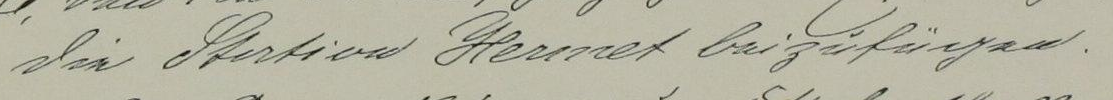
die Station Hermet beizufügen.
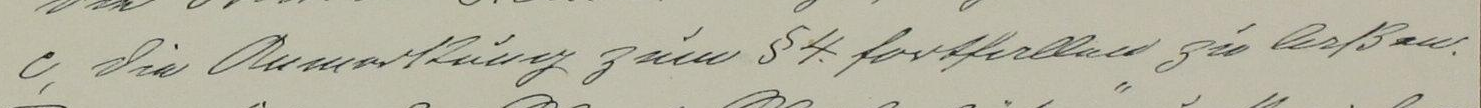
c. die Anmerkung zum § 4. fortfallen zu laßen;
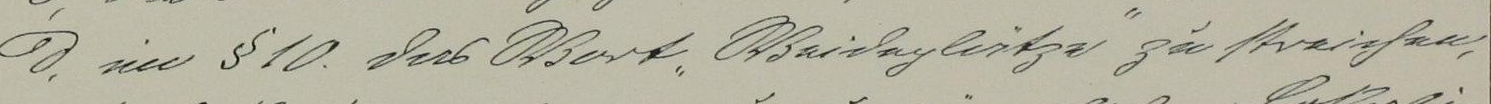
d. im § 10. das Wort „Weideplätze“ zu streichen,
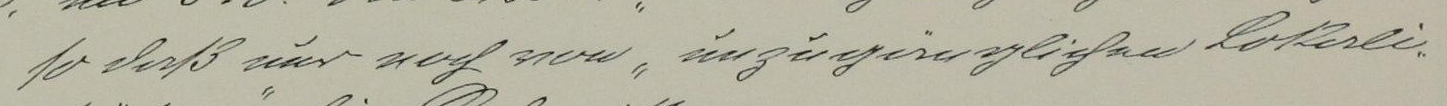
so daß nur noch von „unzugänglichen Lokali-
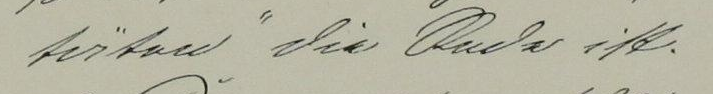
täten“ die Rede ist.
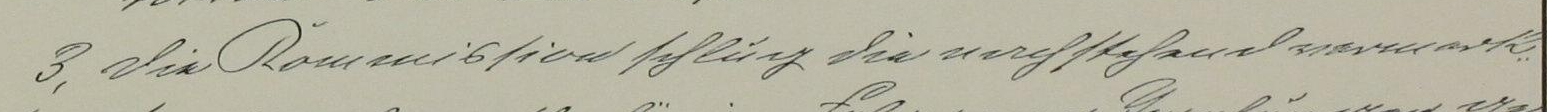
3. Die Kommission schlug die nachstehend vermerk-
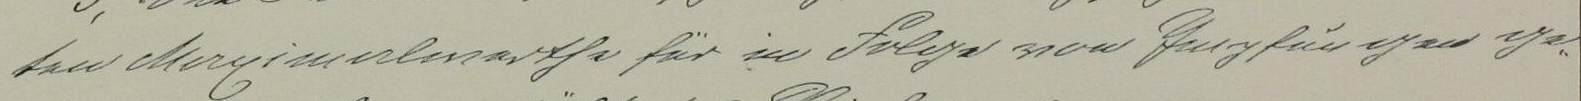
ten Maximalwerthe für in Folge von Impfungen ge-
